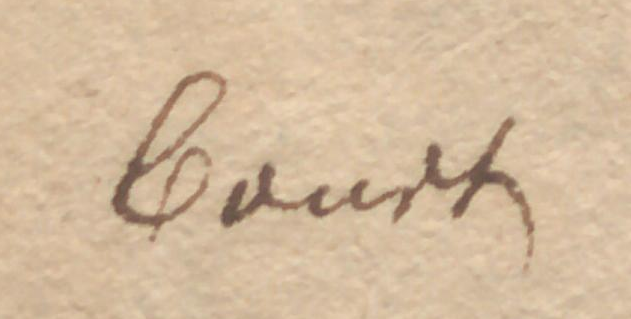Court
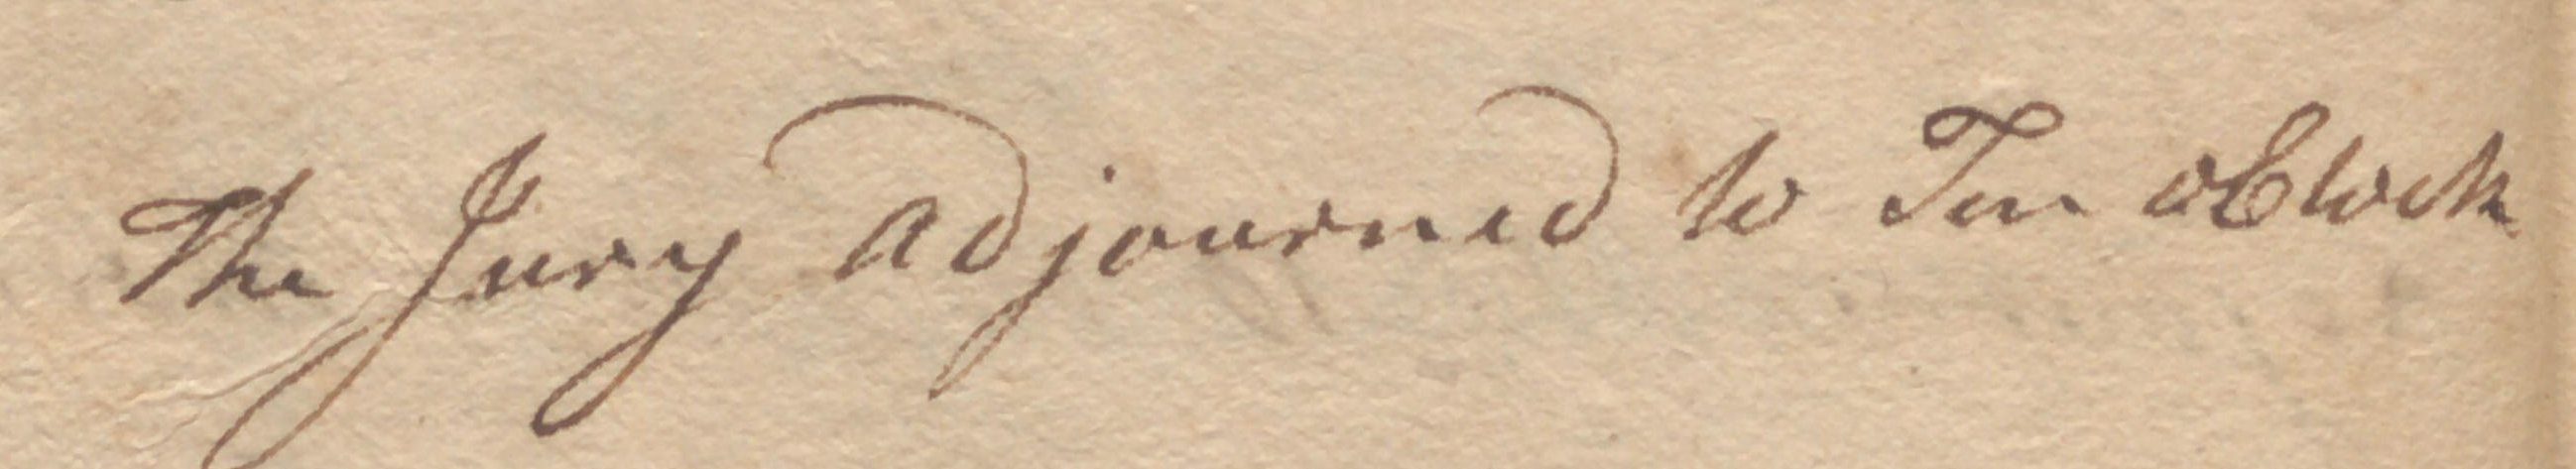The Jury adjourned to Ten oClock
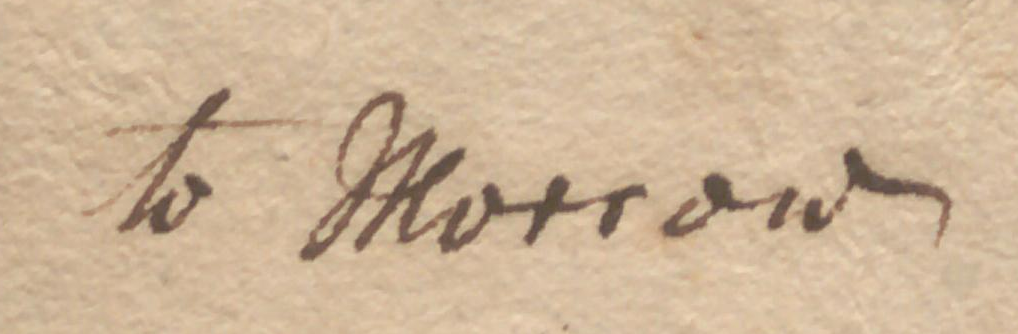to Morrow
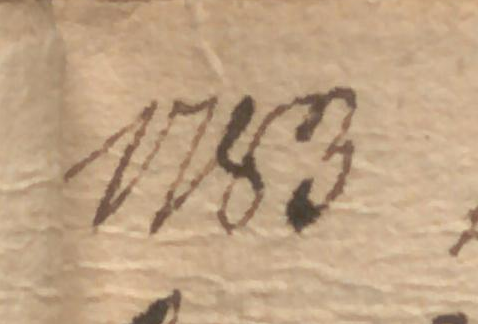1783
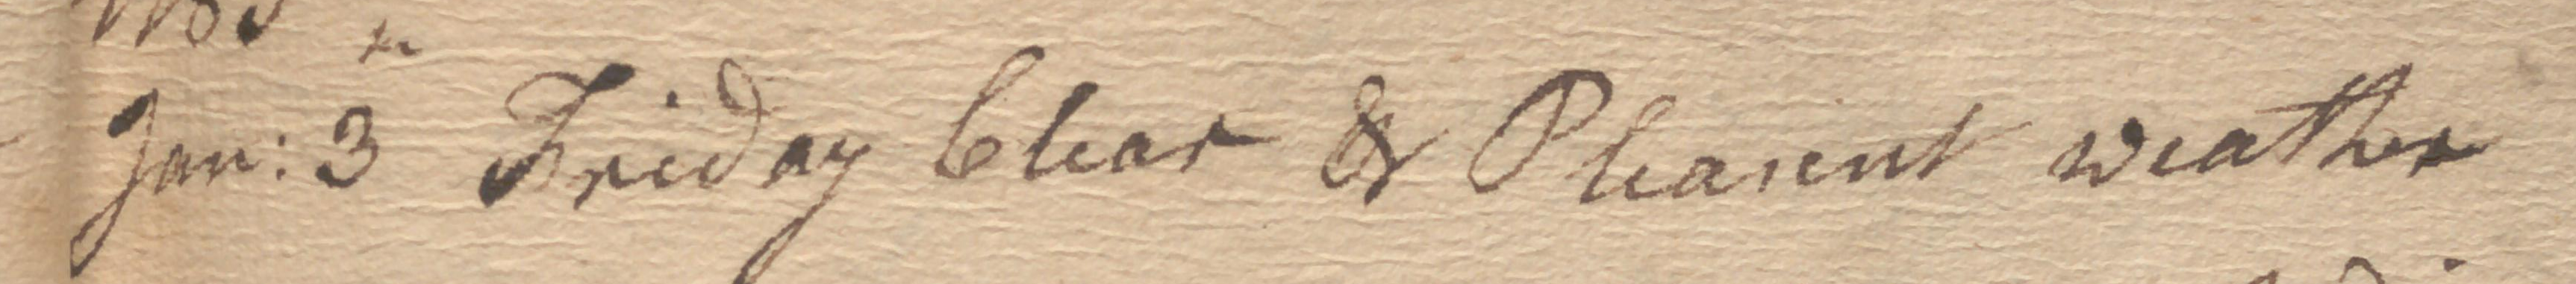Jan: 3 Friday Clear & Pleasent weather
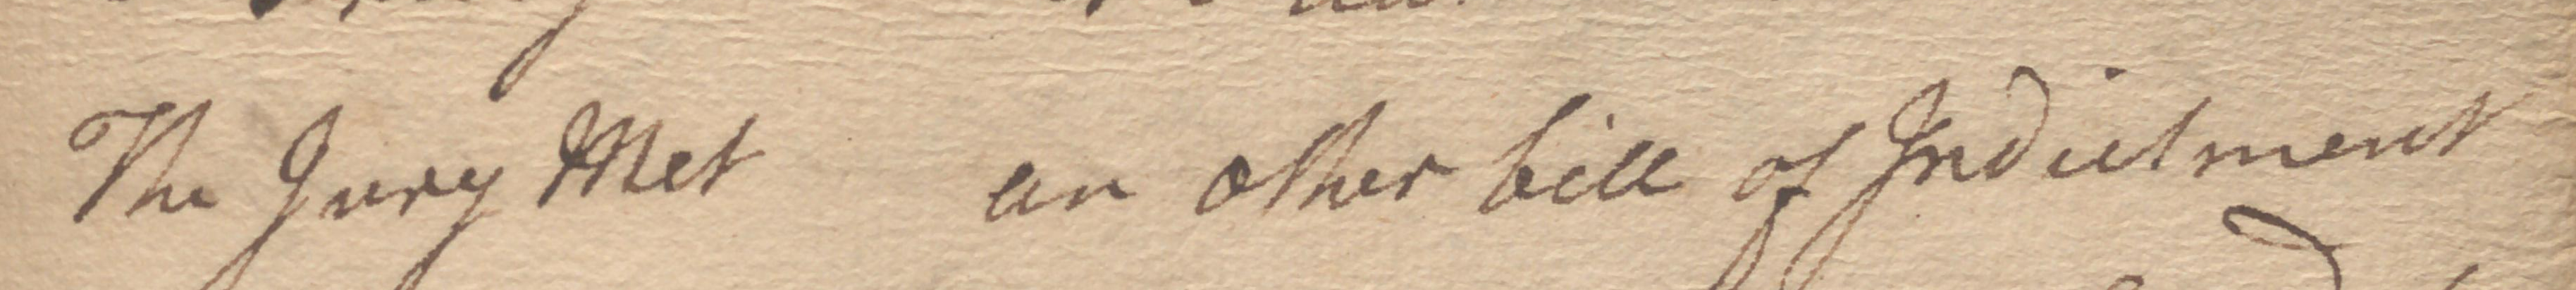The Jury Met an other bill of Indictment
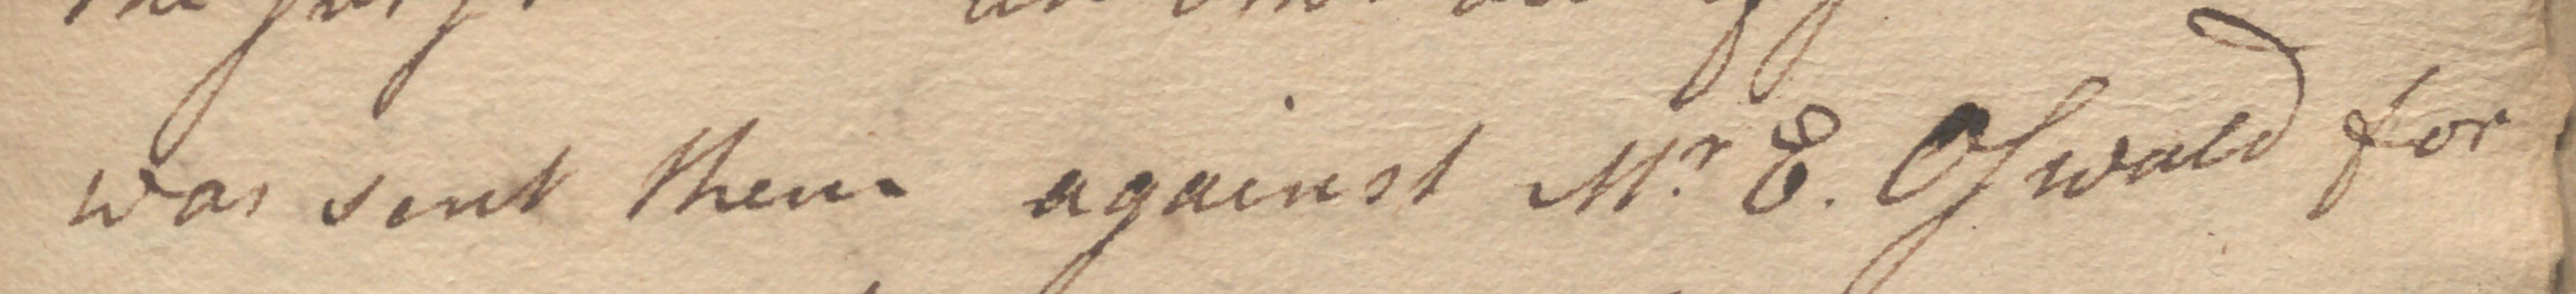was sent them against M^r. E. Oswald for
